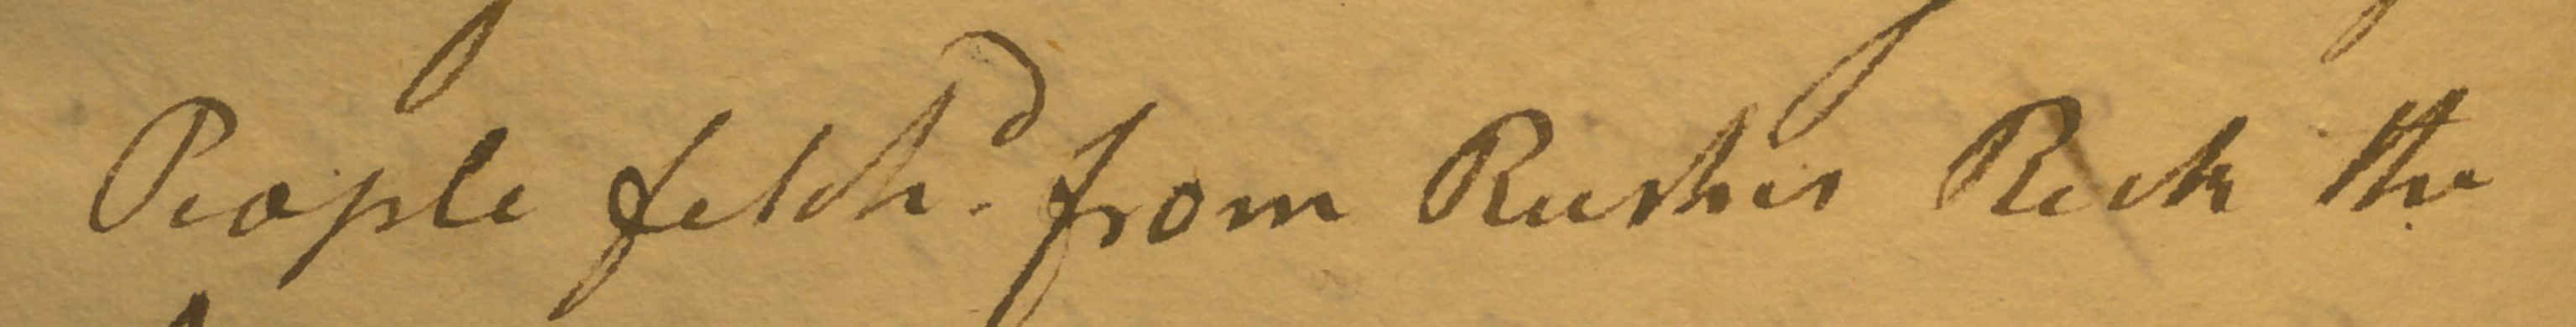People fetch^d. from Rushes Rick the
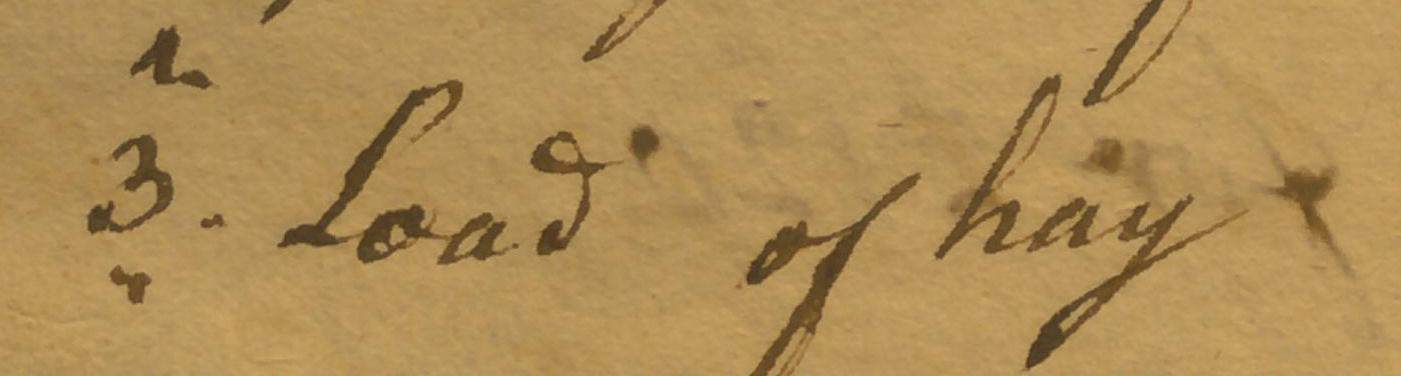3^h. Load of hay
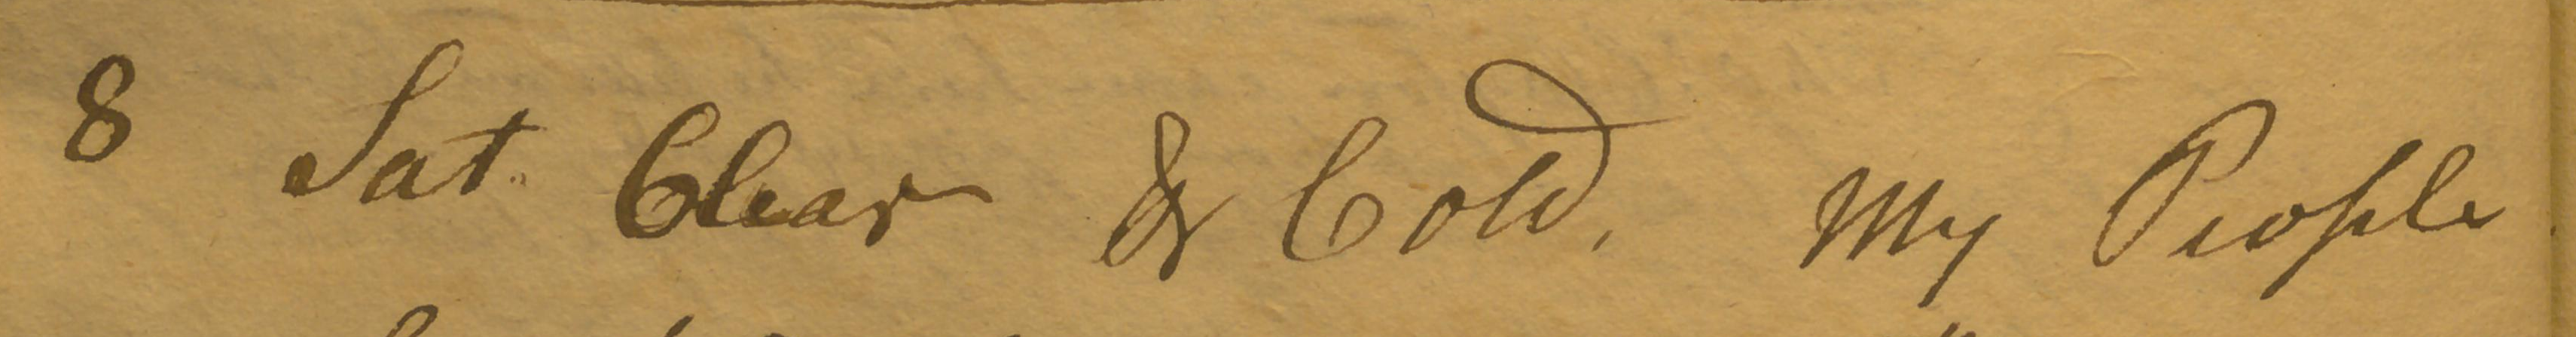8 Sat. Clear & Cold. My People
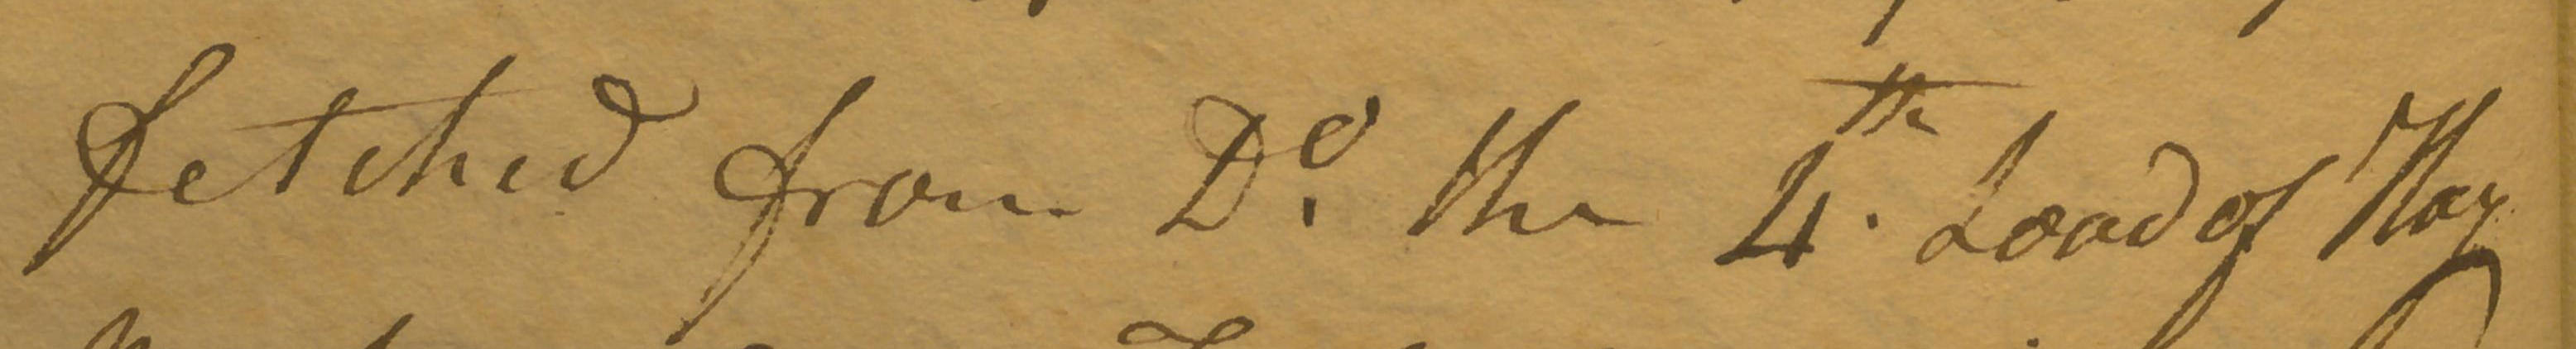fetched from D^o. the 4^th. Load of Hay
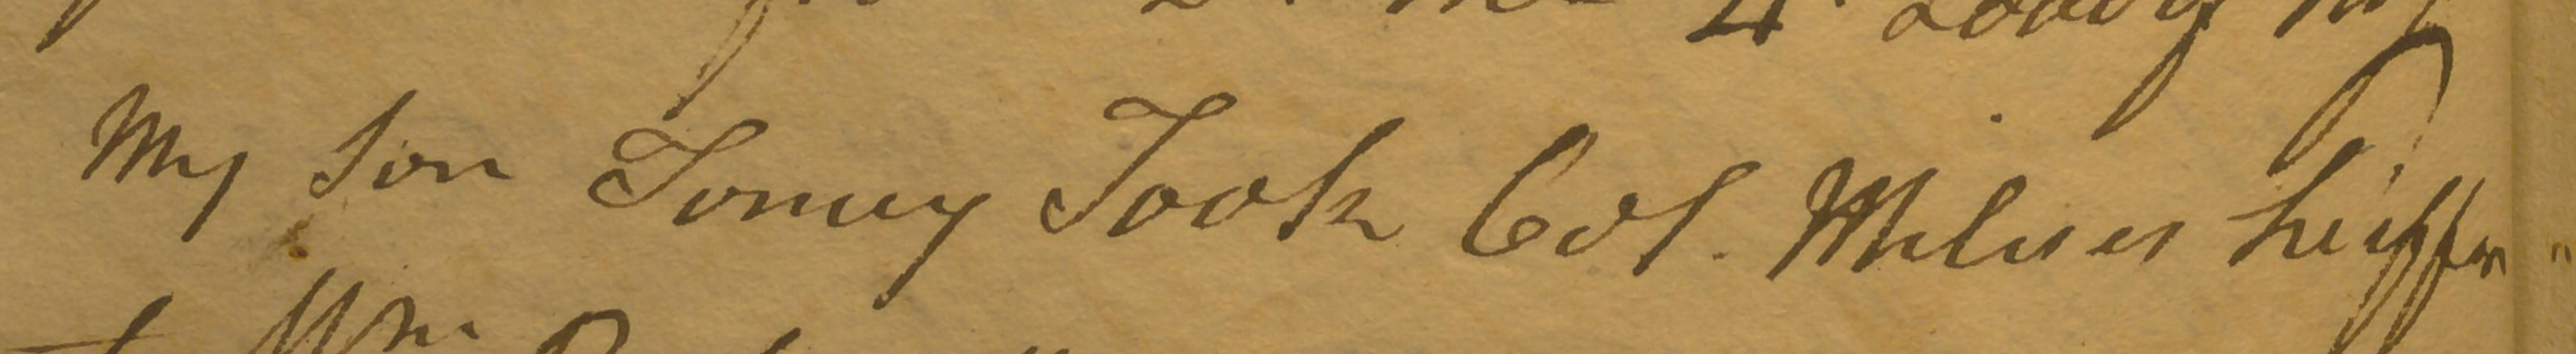My Son Tomey Took Col. Mileses heiffer
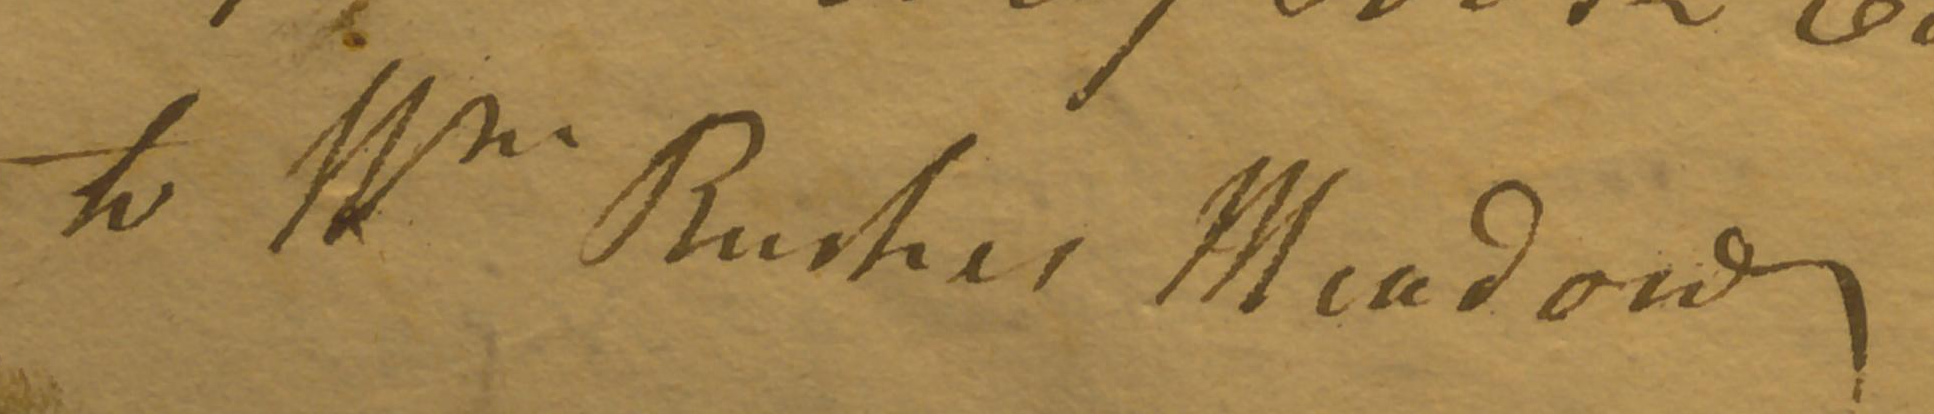to W^m Rushes Meadow
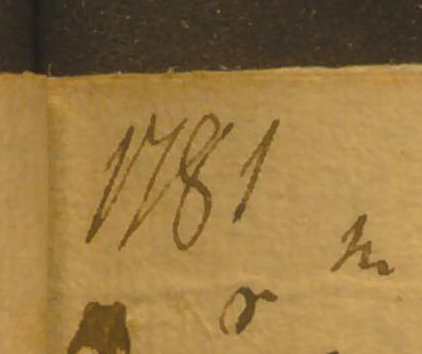1781
